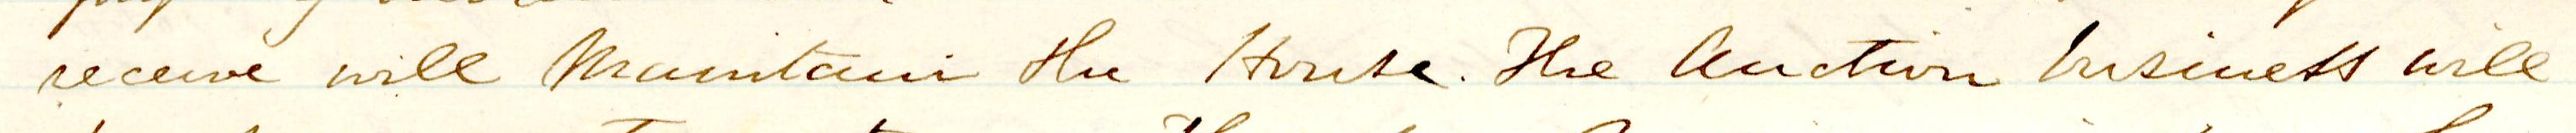receive will maintain the house. the Auction business will
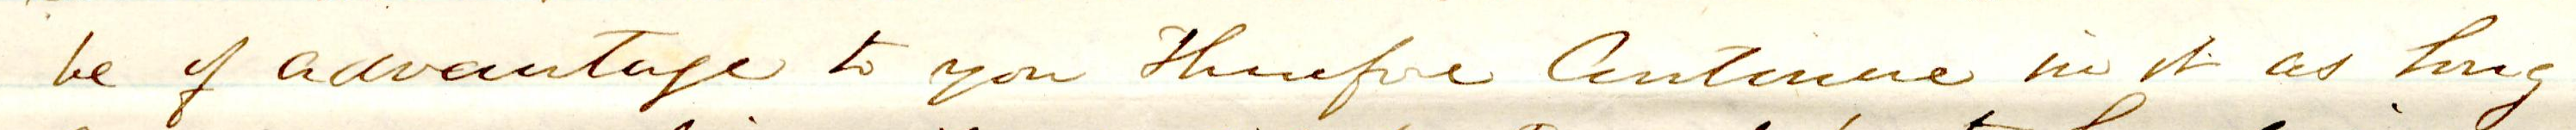be of advantage to you therefore continue in it as long
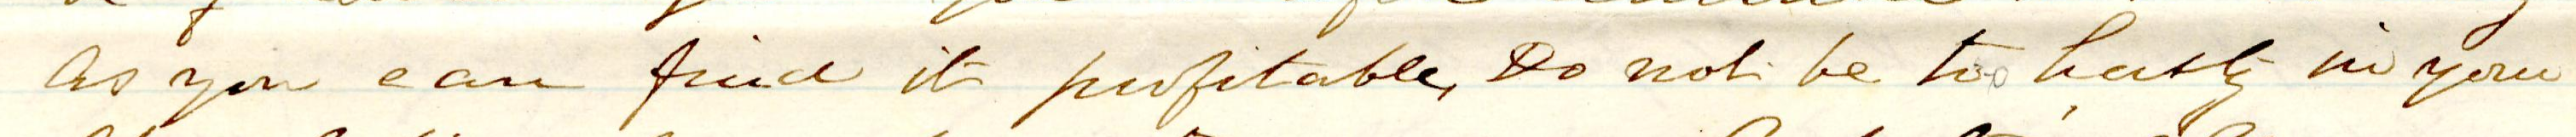As you can find it profitable, Do not be too hasty in your
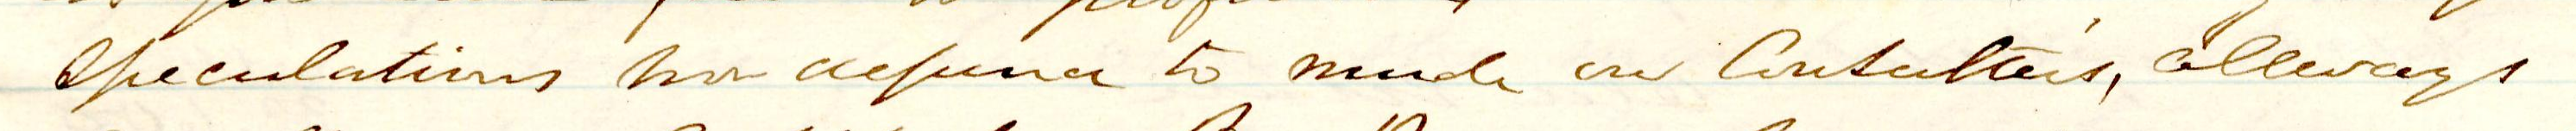Speculations nor depend to much on articles, always
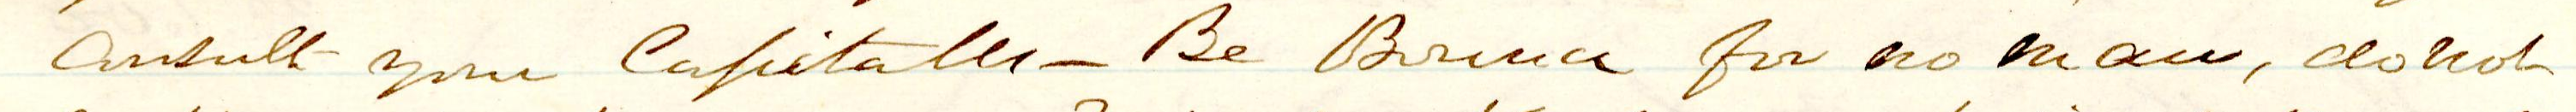Consult your capitalls.- Be Brave for no man, do not
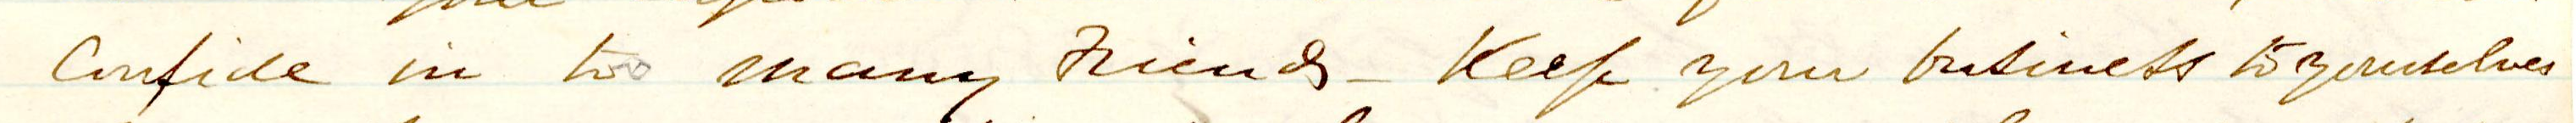confide in too many friends- Keep your business to yourselves
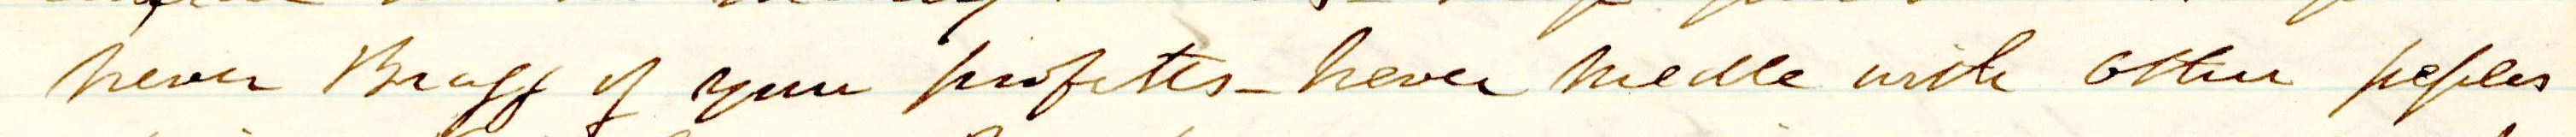never Bragg of your profites- never medle with other peples
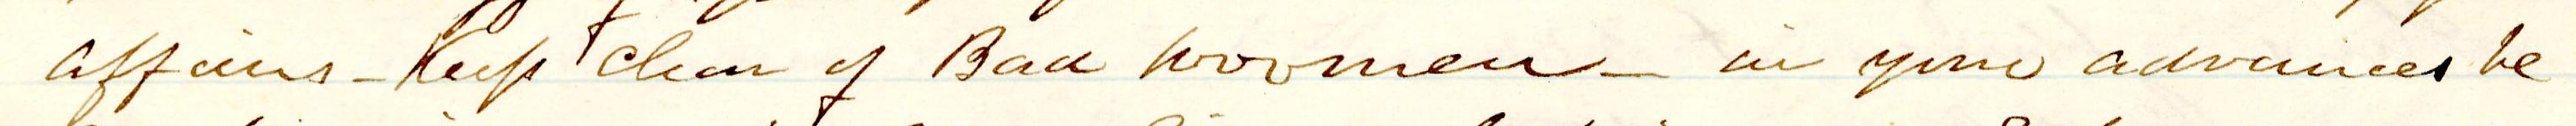affairs- keep clear of Bad promise- in your advances be
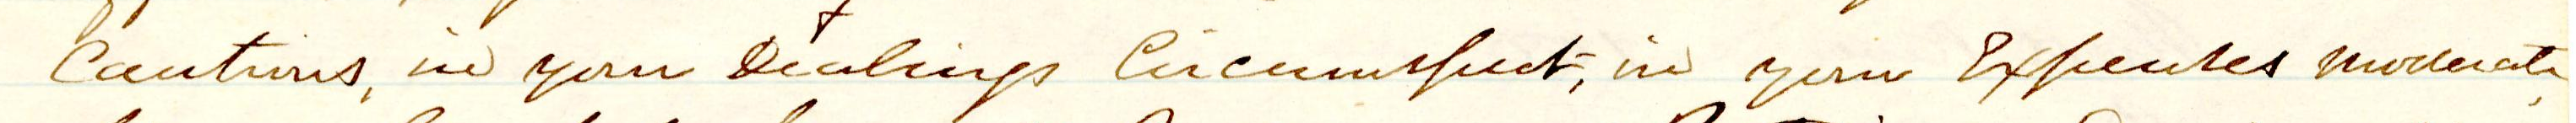Cautious in your dealings Circumspect, in your Expenses moderate
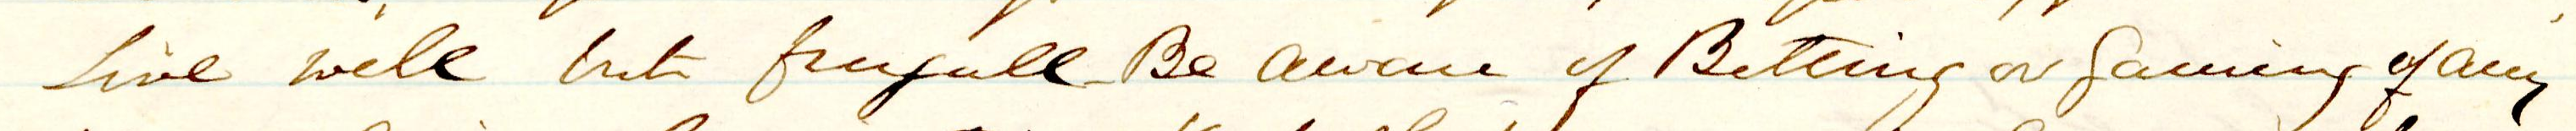Live well but fearfull Be aware of Betting or saving of any
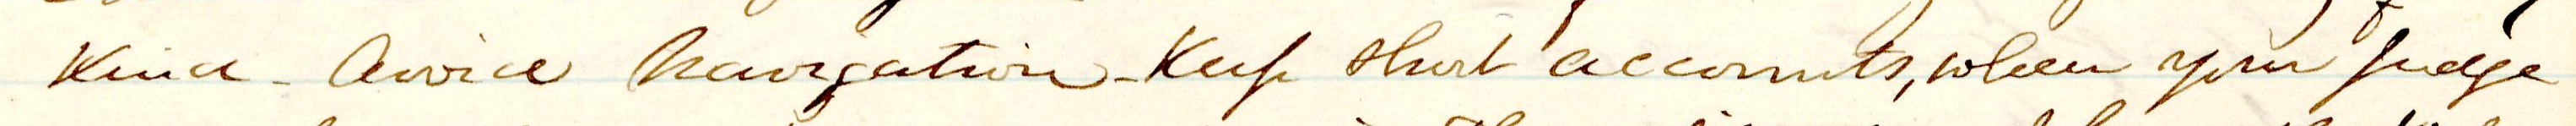Kind- Advice Navigation- Keep short accounts, when you Judge
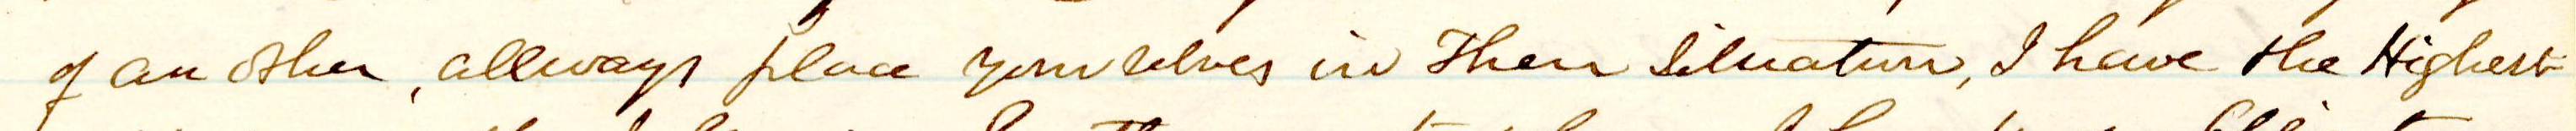of an other, allways place yoursleves in their situation, I have the Highest
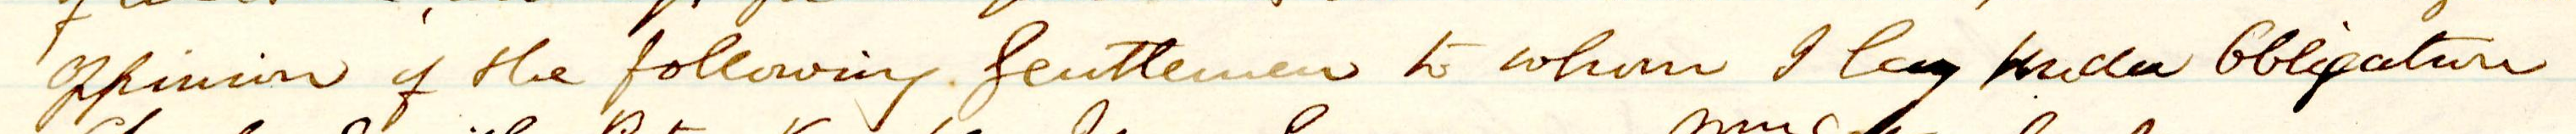oppinion of the following gentlemen to whom I lay under Obligation
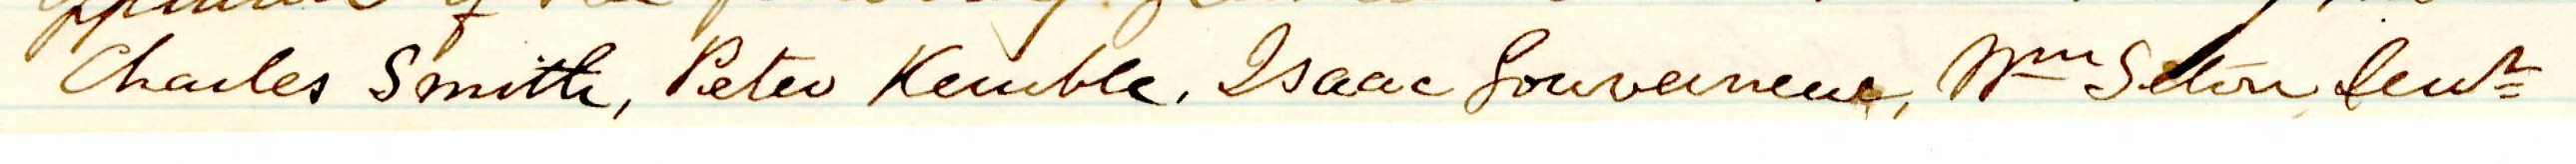Charles Smith, Peter Kemble, Isaac Provenience, M^rs Selen Levy
